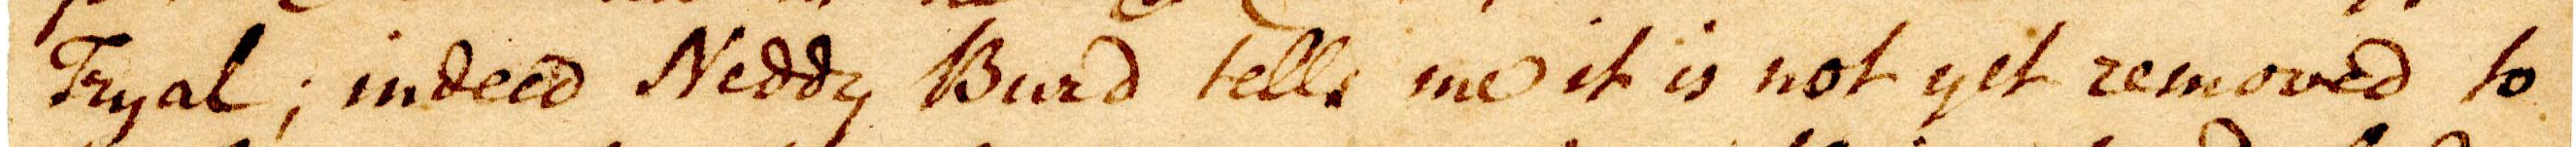Tryal; indeed Neddy Burd tells me it is not yet removed to
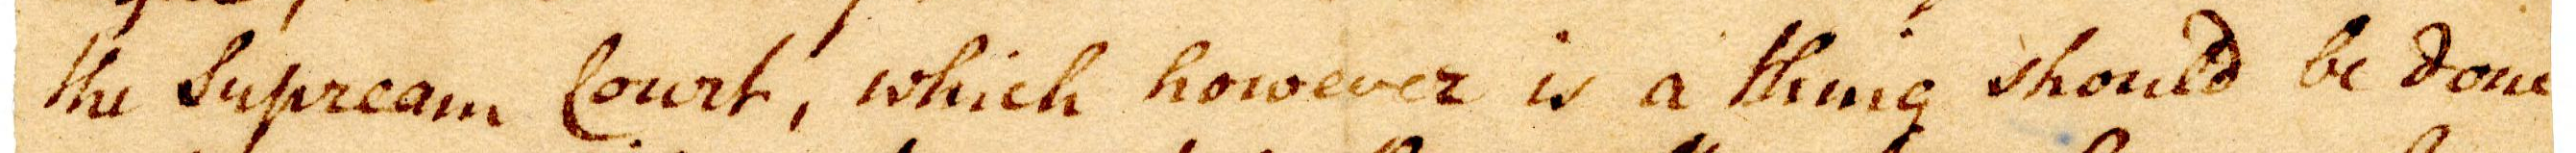the Supream Court, which however is a thing should be done
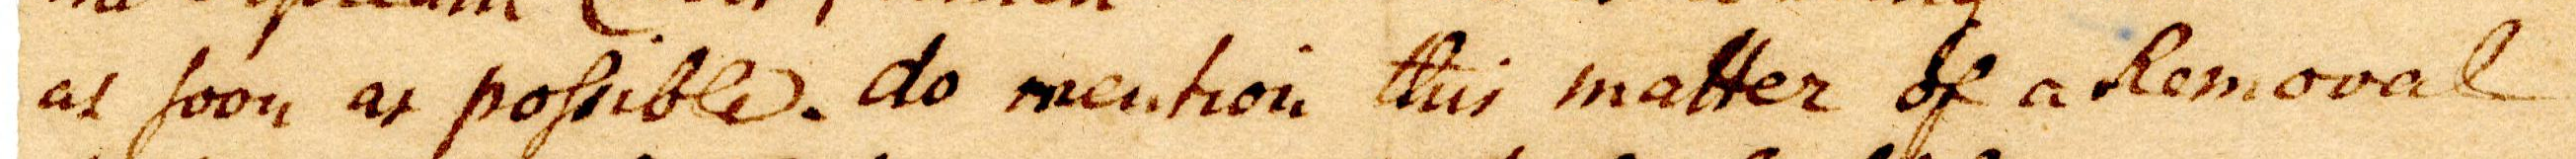as soon as possible. do mention this matter of a Removal
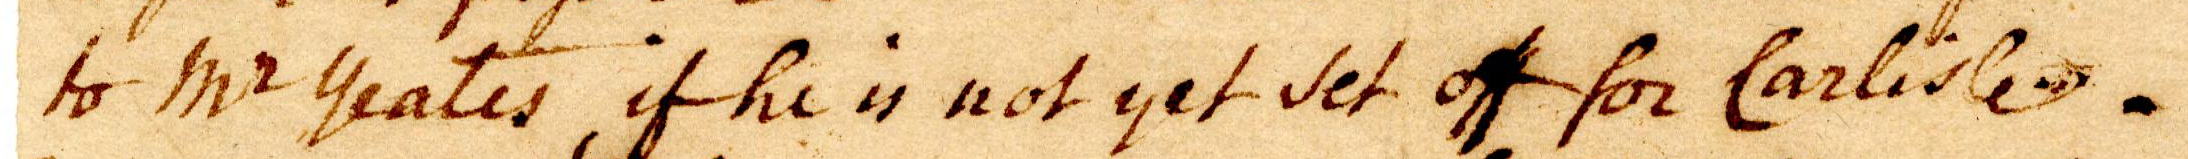to M^r Yeates, if he is not yet set off for Carlisle.
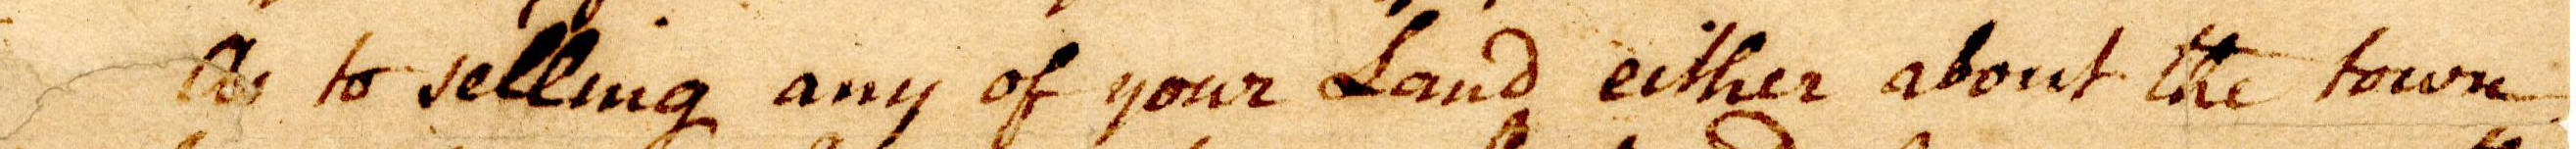As to selling any of your Land either about the town
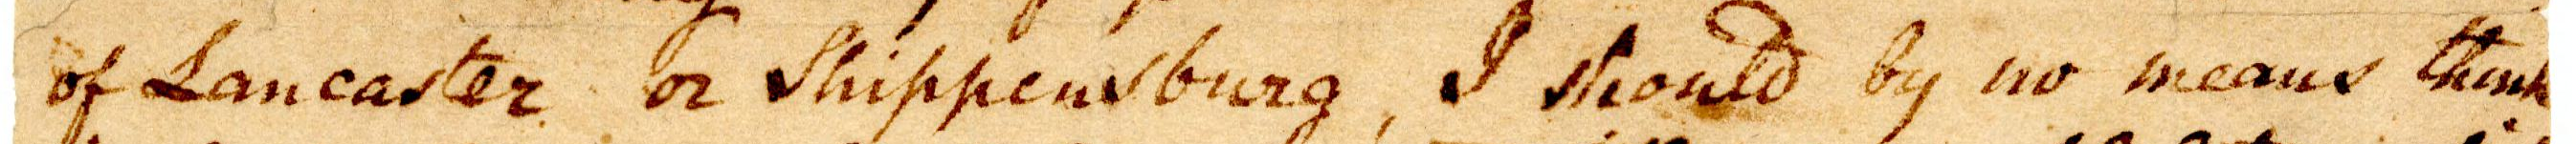of Lancaster or Shippensburg, I should by no means think
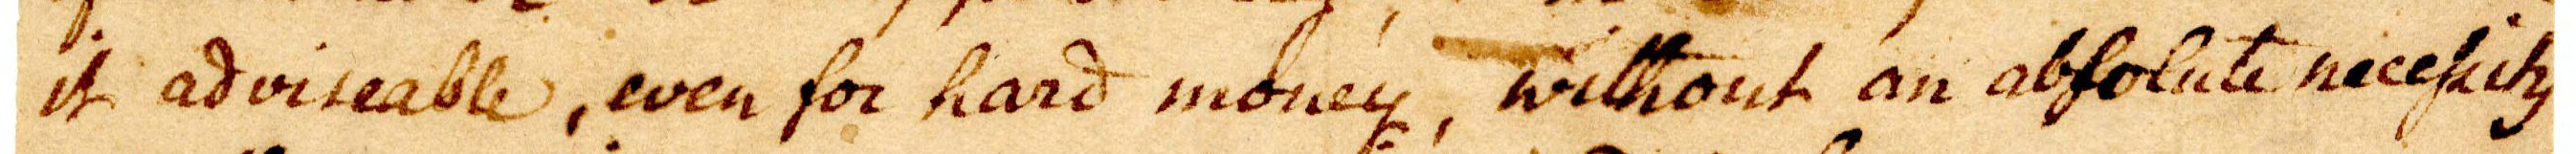it adviseable, even for hard money, without an absolute necessity
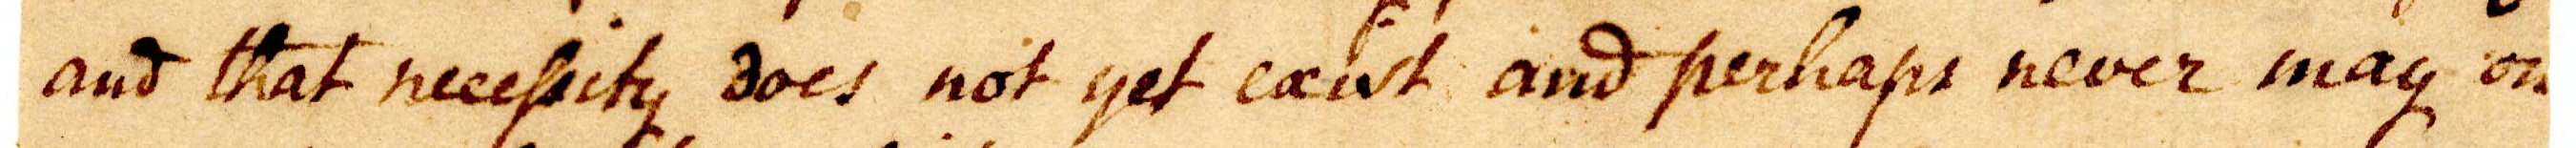and that necessity does not yet exist and perhaps never may on
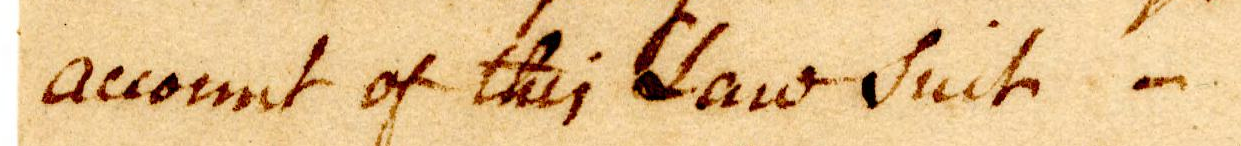account of this Law Suit -
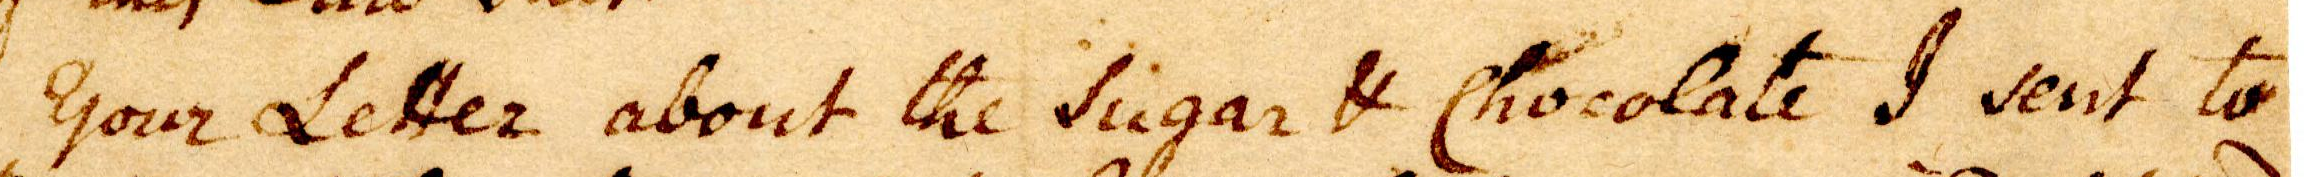Your Letter about the Sugar & Chocolate I sent to
